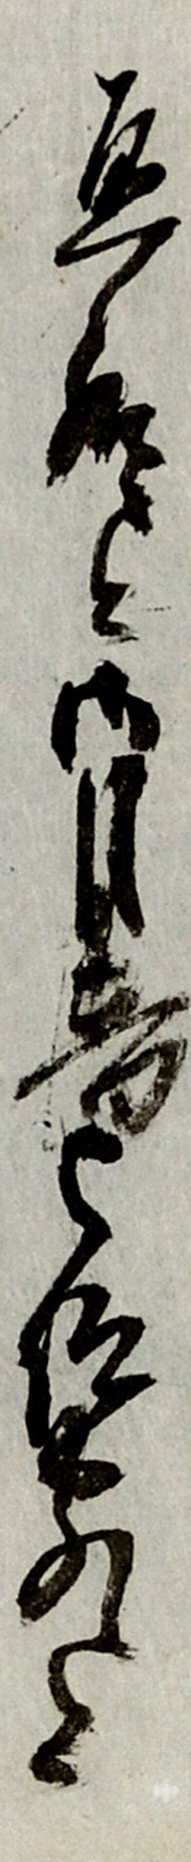達候様ニと御月番被仰聞候以上
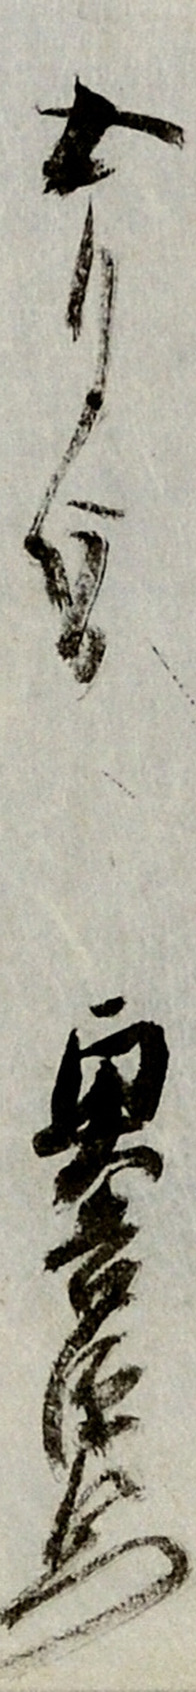五月八日奥谷源左衛門
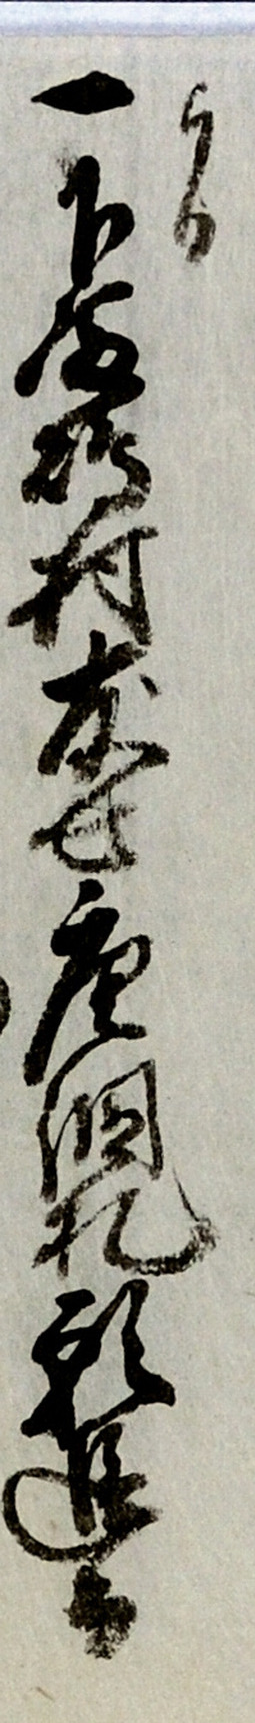一下殿嶋村友七唐綱札願追而
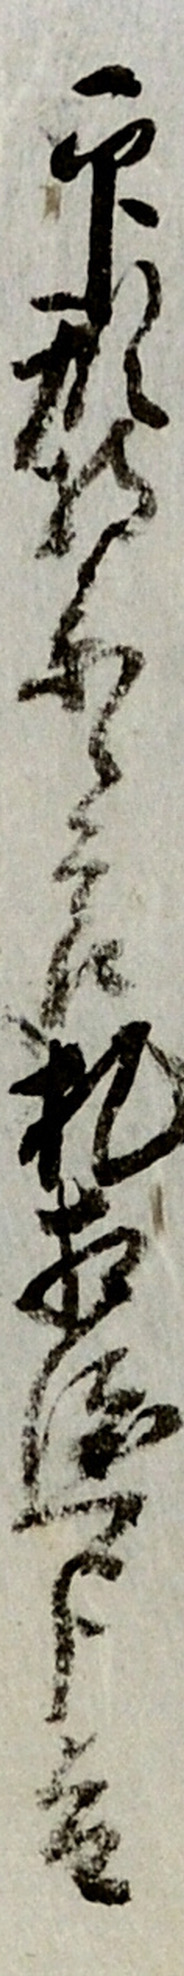印形持参候節札相添可申旨
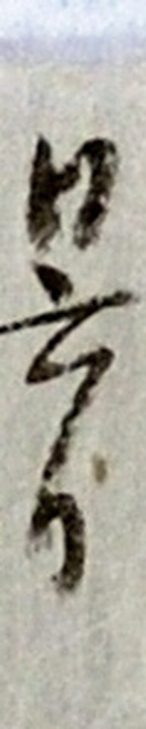同六日
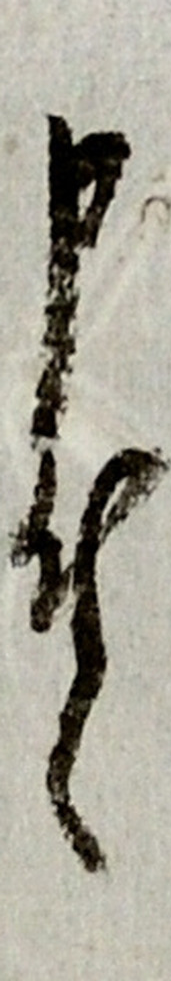申付候
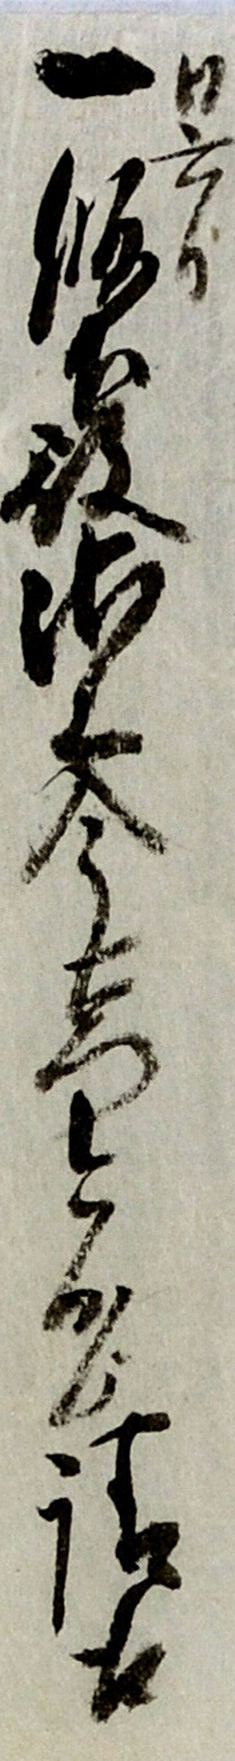一仮下役池上今右衛門今日ゟ請取
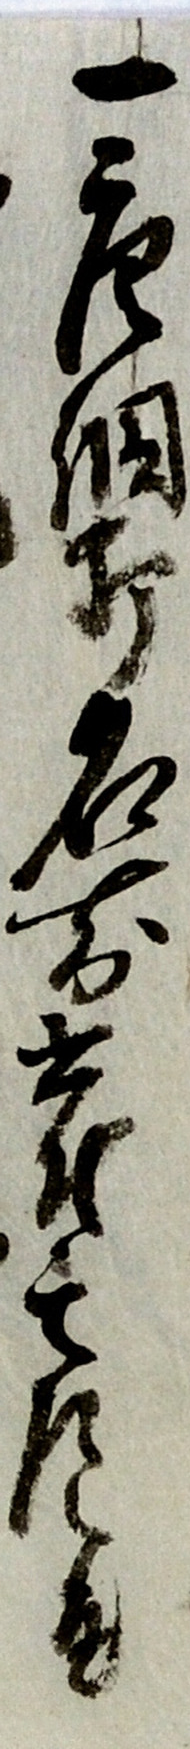一唐網打名前書付は左之通
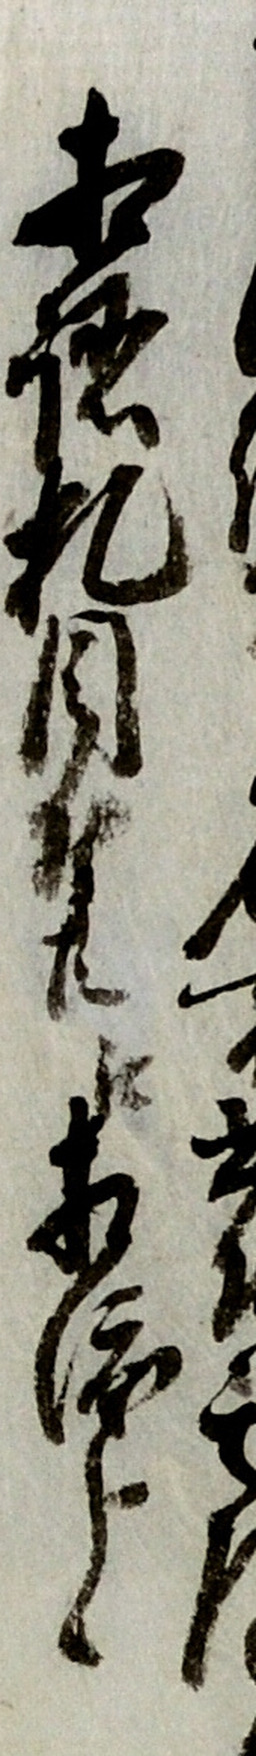相認札目付共え相渡申候
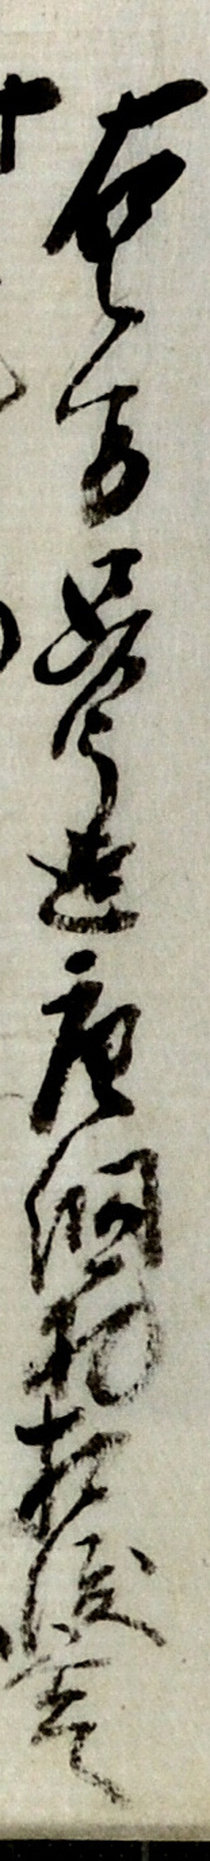右之方只今迄唐網札相渡無之
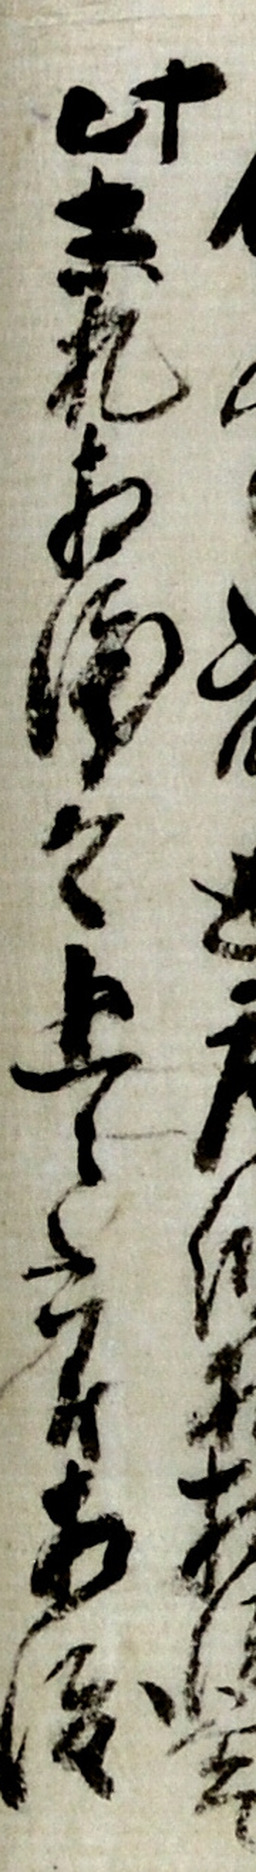此書札相渡候ハヽ上付相渡

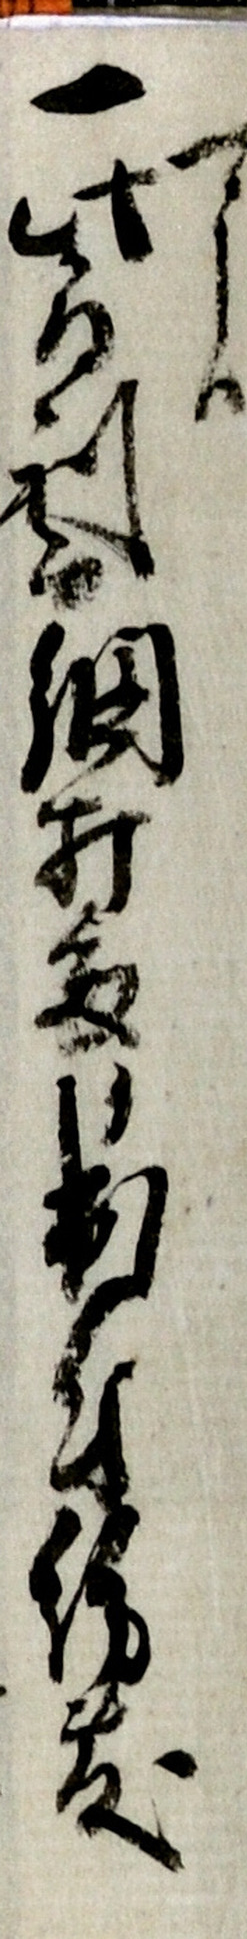一此間利而網打多ク出候付紛敷
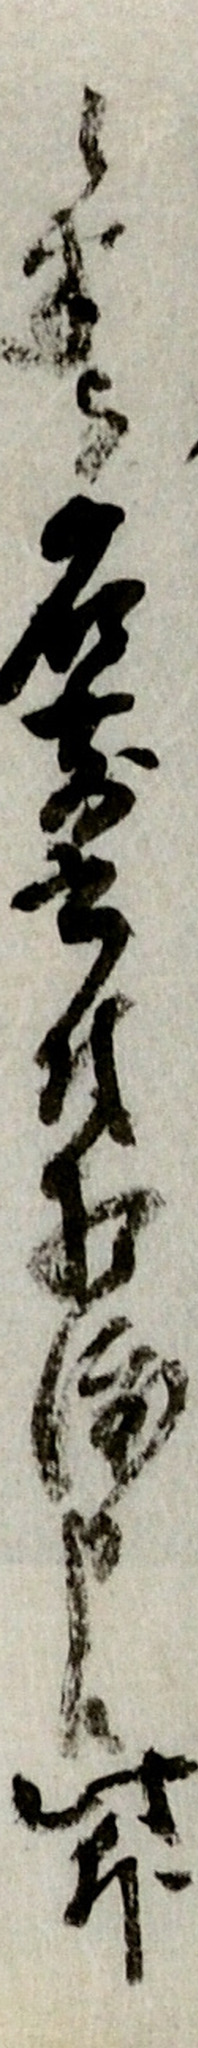候半と名前書付相渡申候此外
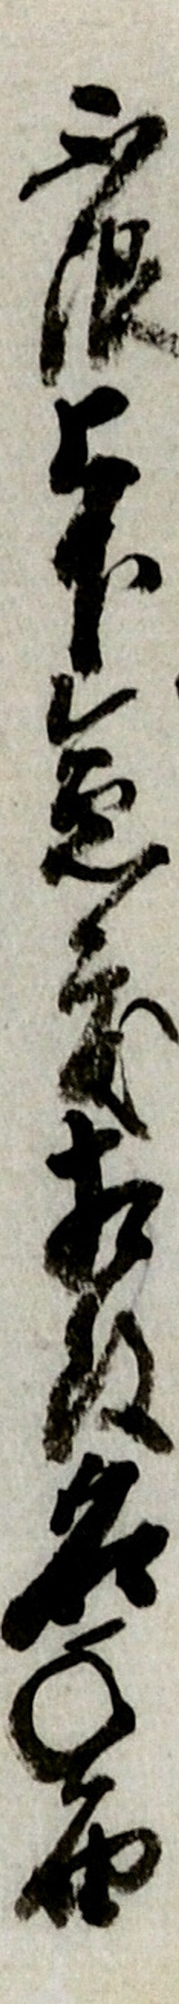不限上下急度相改名承届
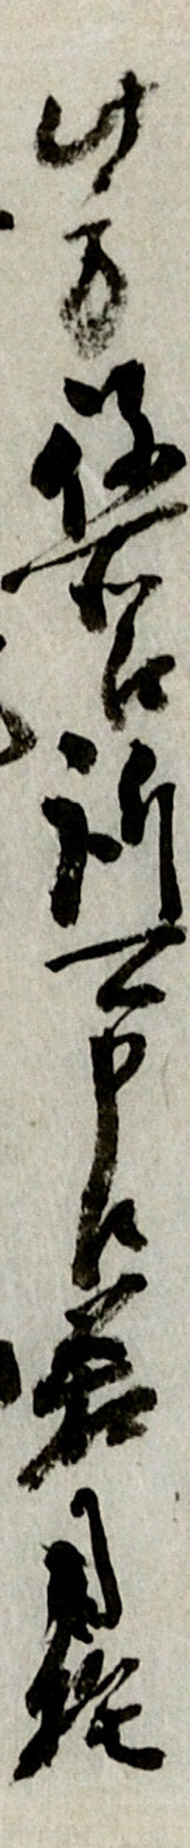此方役所え訴可申候若用
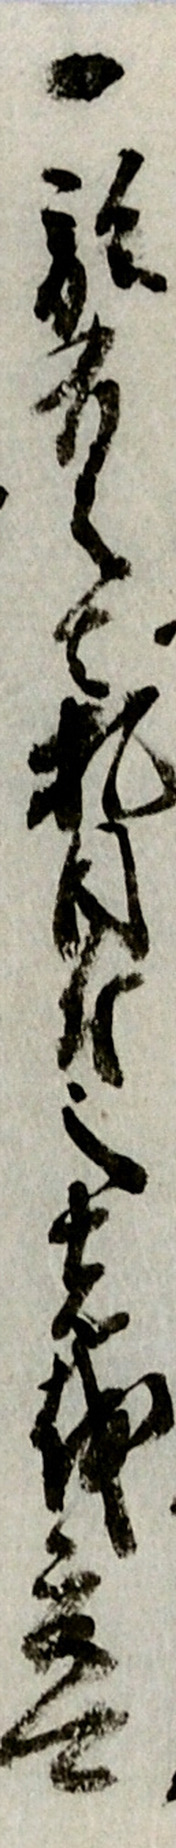一於有之は札目付之者を可
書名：分一方諸事御用留帳
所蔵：伊那市立高遠町図書館・合同会社AMANE
